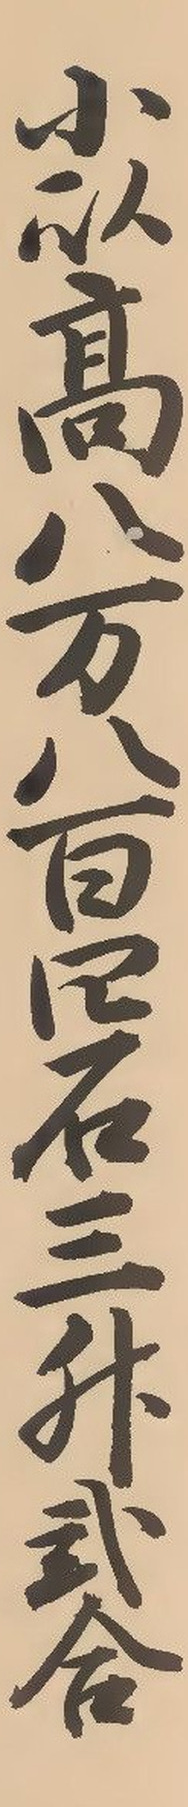小以高八万八百四石三升弐合

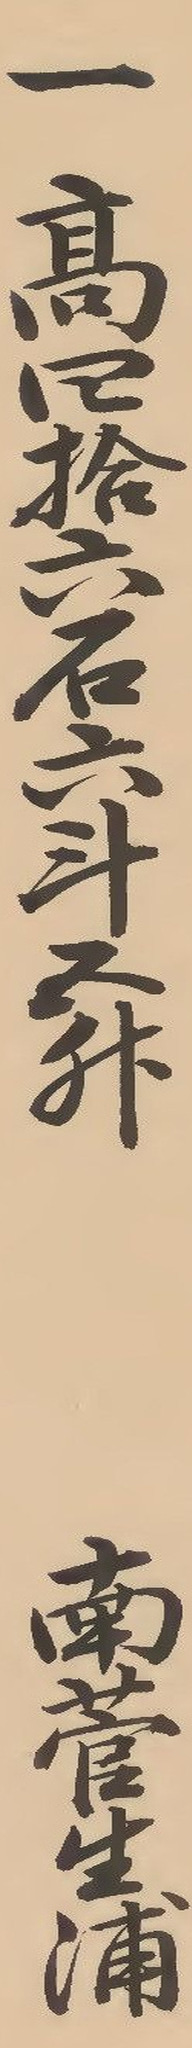一高四拾六石六斗五升南菅生浦
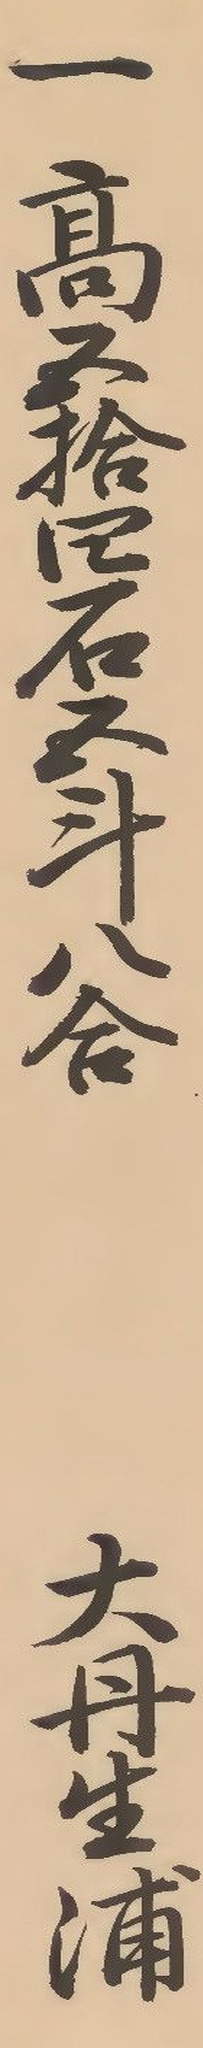一高五拾四石五斗八合大丹生浦
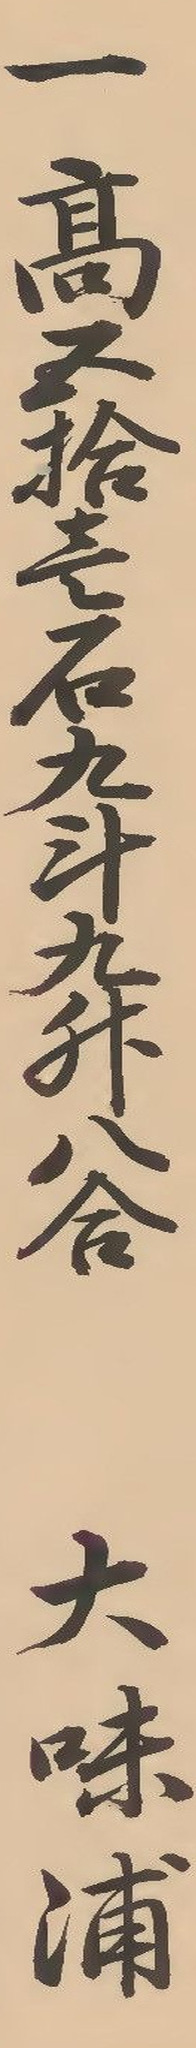一高五拾壱石九斗九升八合大味浦
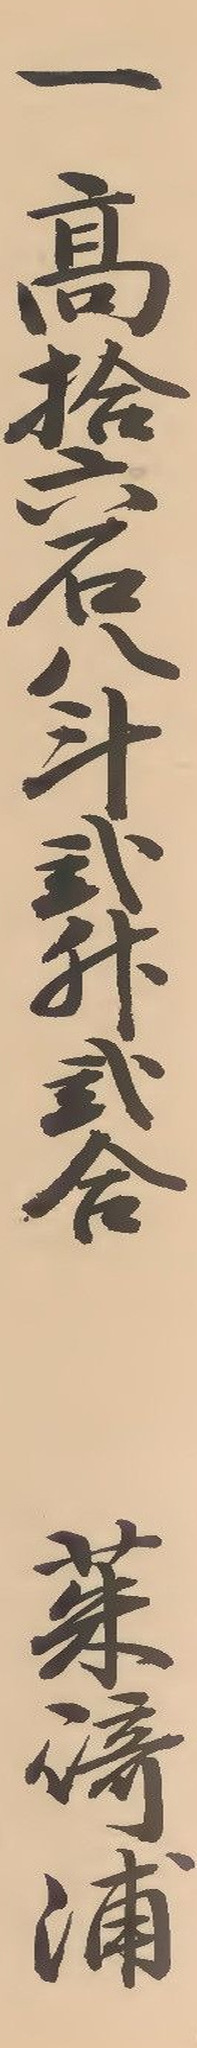一高拾六石八斗弐升弐合茱崎浦
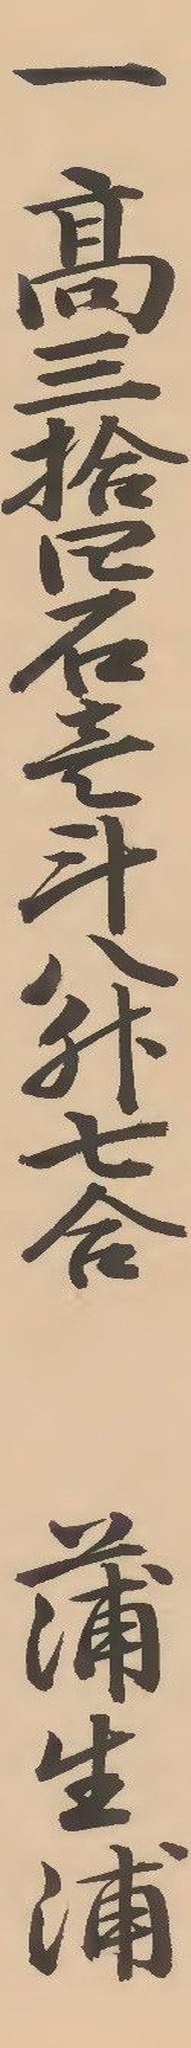一高三拾四石壱斗八升七合蒲生浦
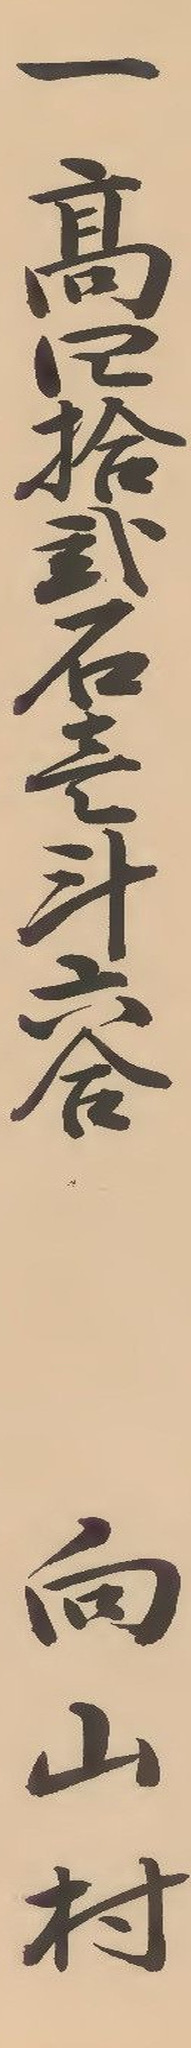一高四拾弐石壱斗六合向山村
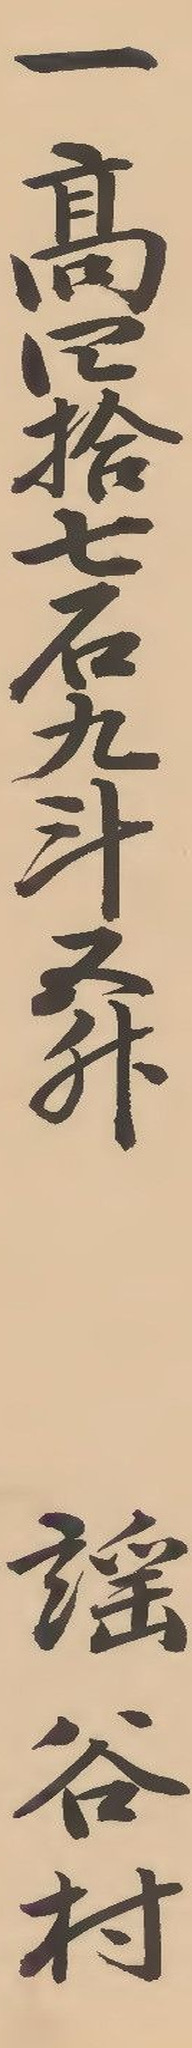一高四拾七石九斗五升謡谷村

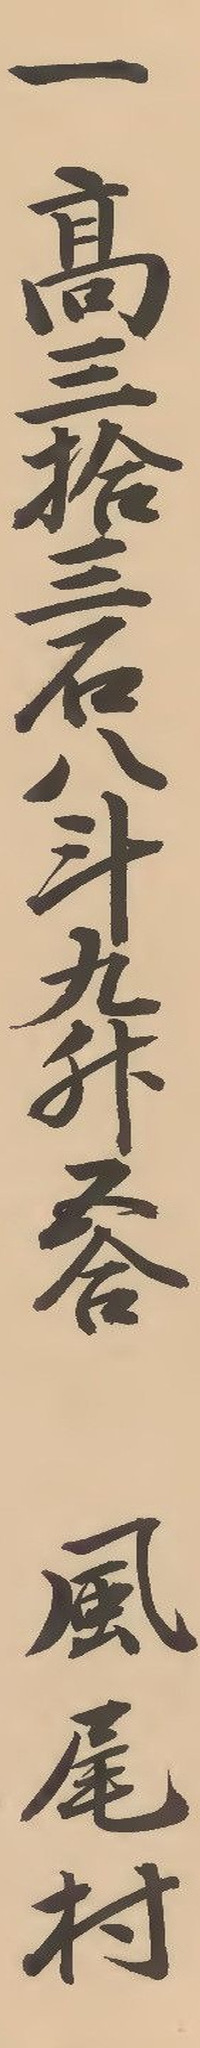一高三拾三石八斗九升五合風尾村
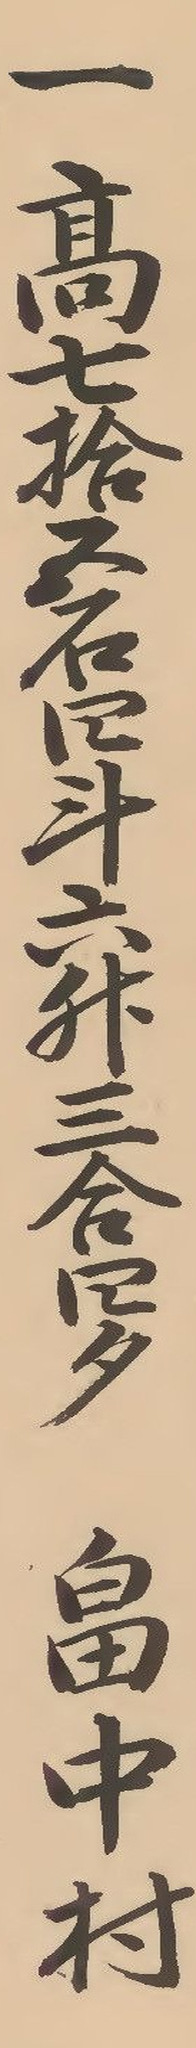一高七拾五石四斗六升三合四勺畠中村
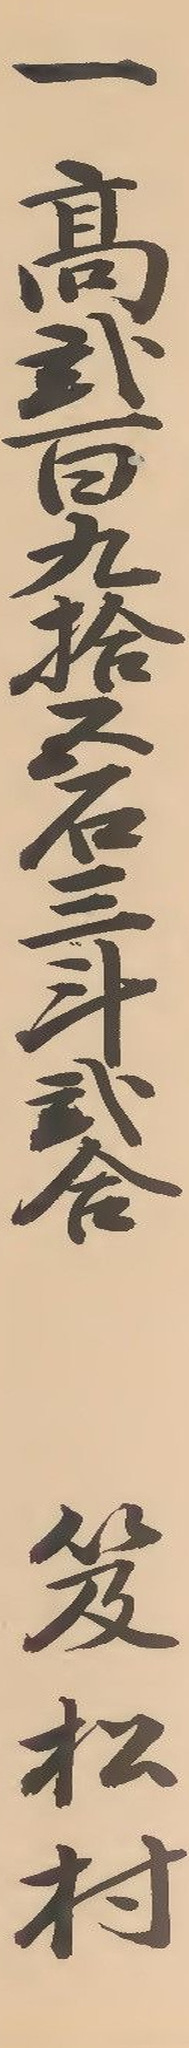一高弐百九拾五石三斗弐合笈松村
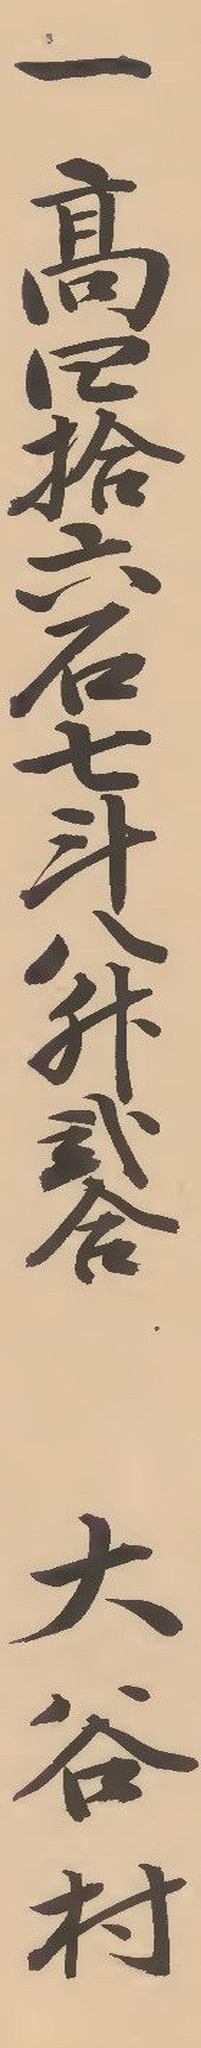一高四拾六石七斗八升弐合大谷村

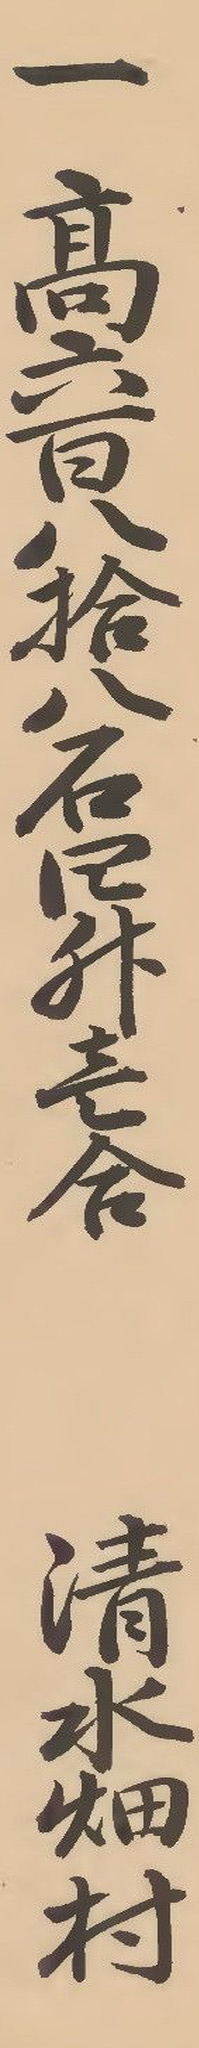一高六百八拾八石四升壱合清水畑村
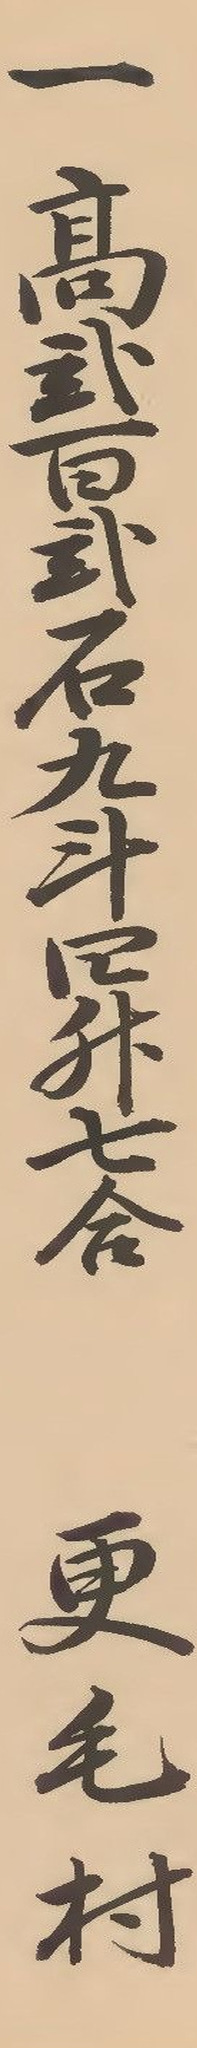一高弐百弐石九斗四升七合更毛村
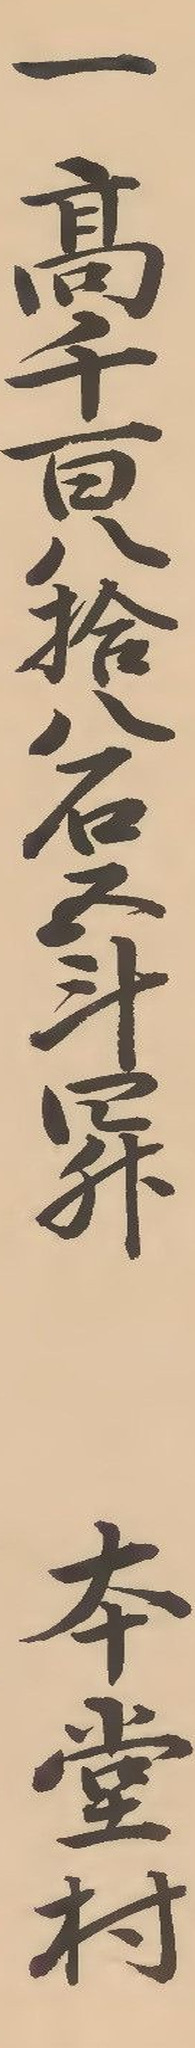一高千百八拾八石五斗四升本堂村
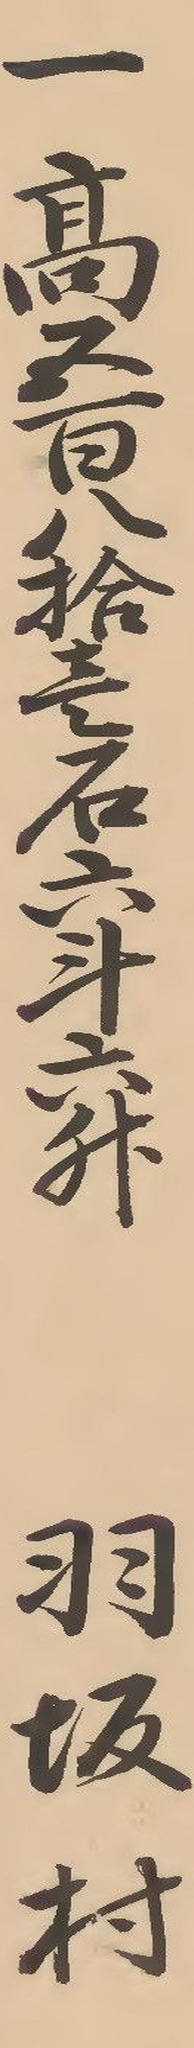一高五百八拾壱石六斗六升羽坂村
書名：越前国郷帳
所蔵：国立公文書館 National Archives of Japan
